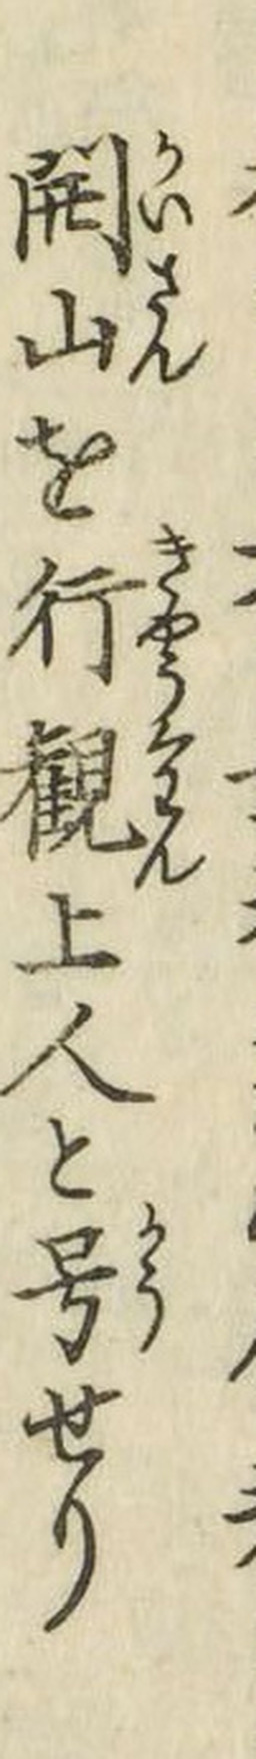開山を行観上人と号せり
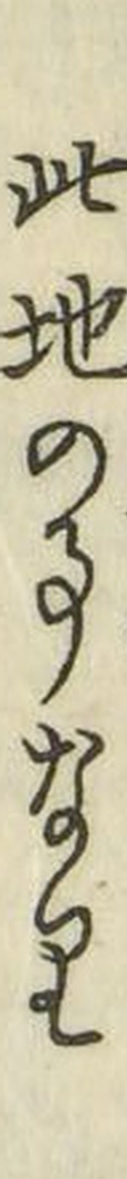此地の事なり
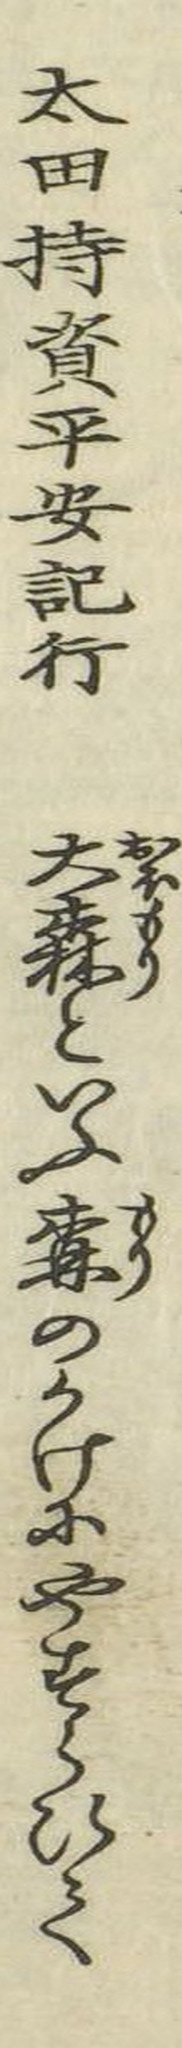太田持資平安紀行大森といふ森のかけにやすらひて
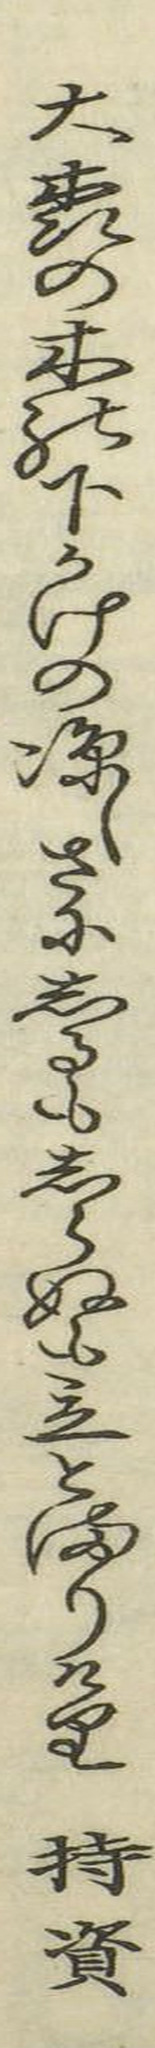大森の木の下かけの凉しさにしるもしらぬも立とまりけり持資
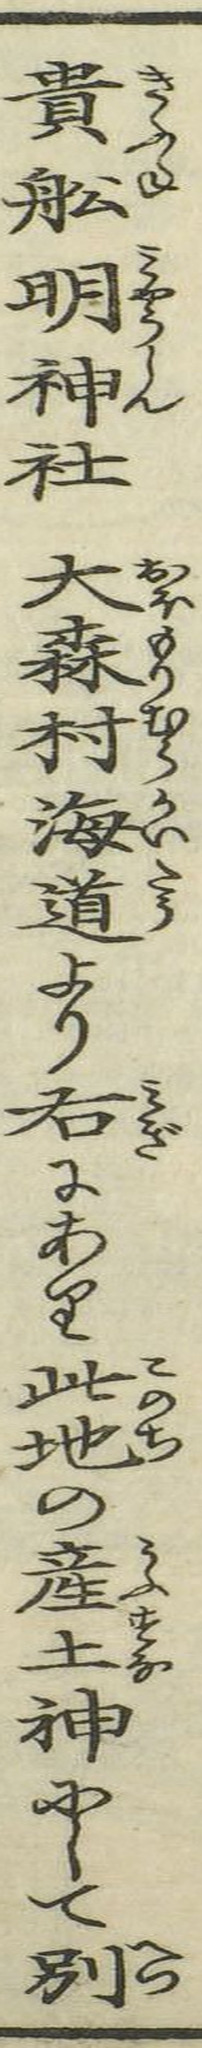貴舩明神社大森村海道より右にあり此地の産土神にして別
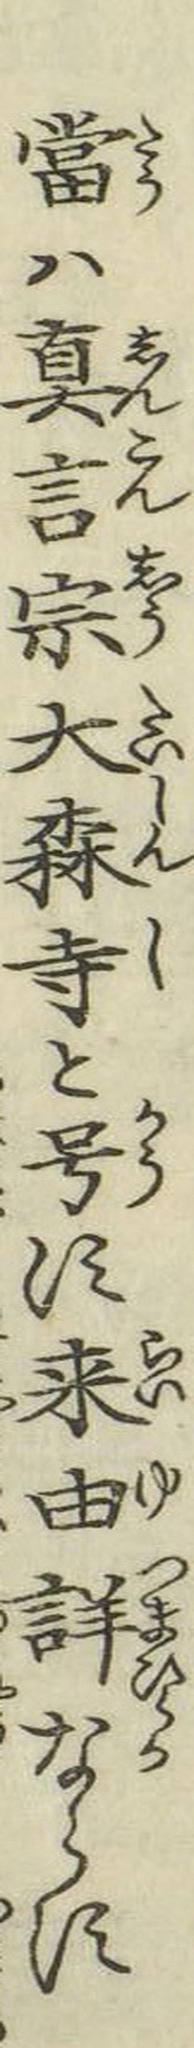當は真言宗大森寺と号す来由詳ならす

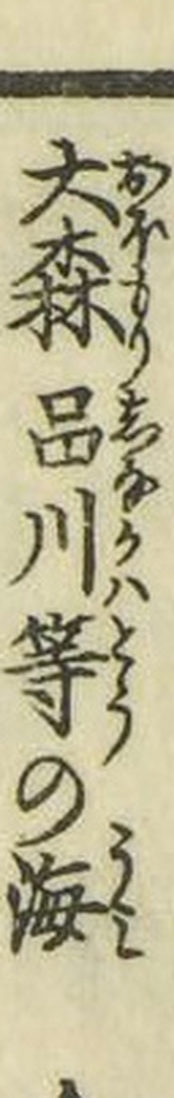大森品川等の海
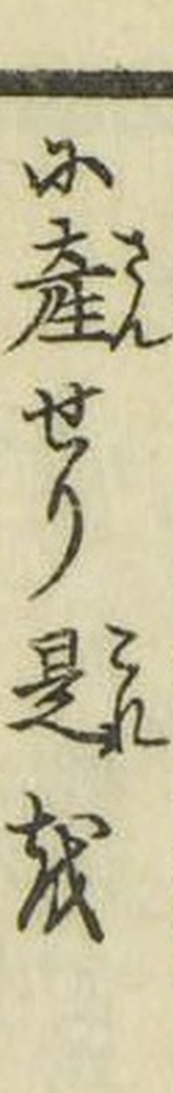に産せり是を
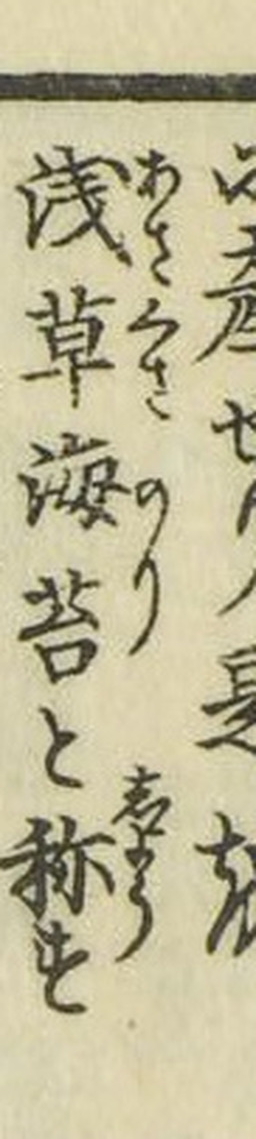浅草海苔と称す
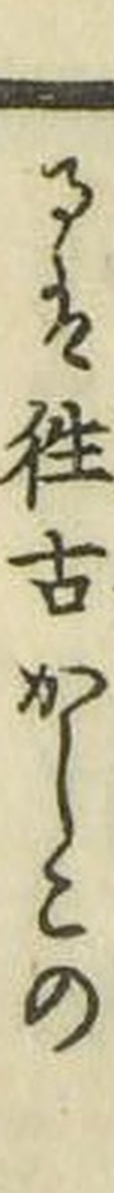るは往古かしこの
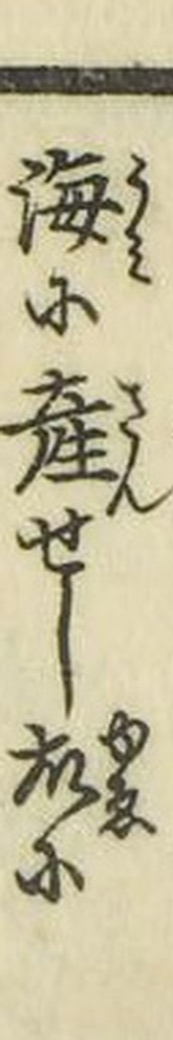海に産せし故に
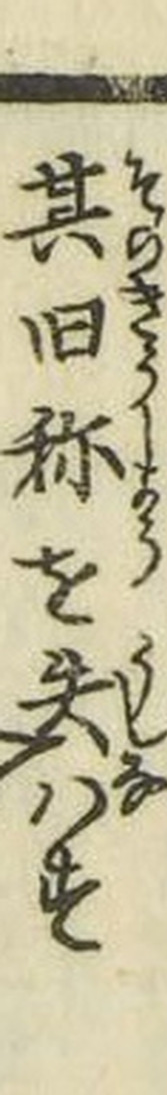其旧称を失はす
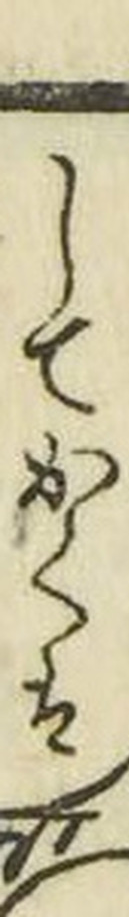してかくは
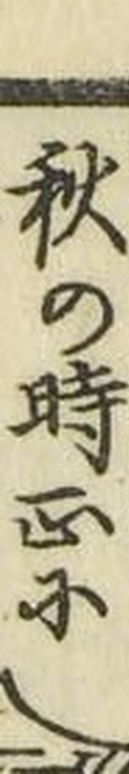秋の時正に
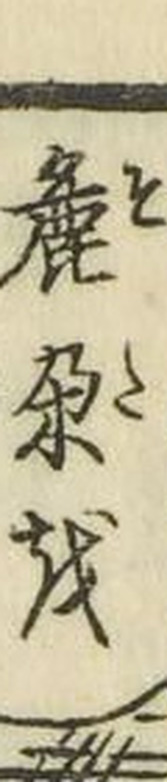麁朶を
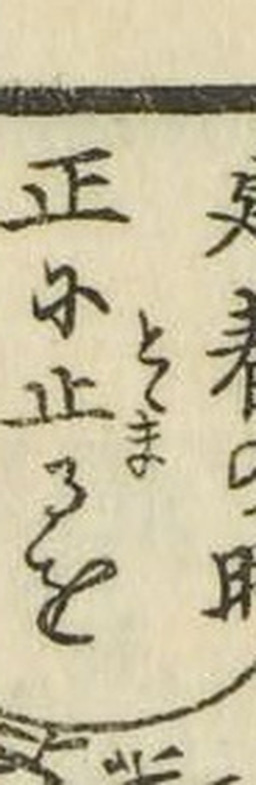正に止るを
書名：江戸名所図会 20巻 巻之4
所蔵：東京学芸大学教育コンテンツアーカイブ
